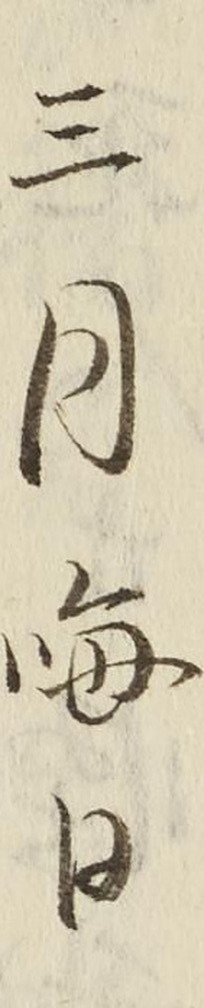三月晦日
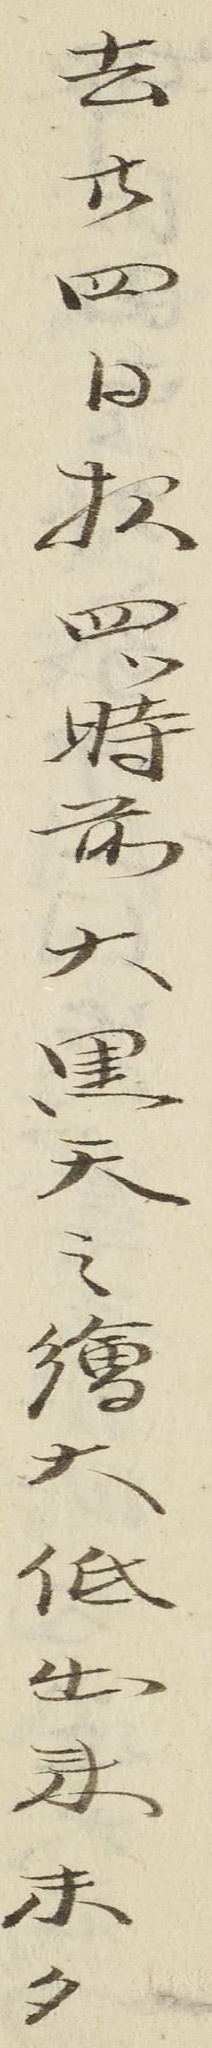去廿四日夜四ッ時前大黒之絵大抵出来未タ
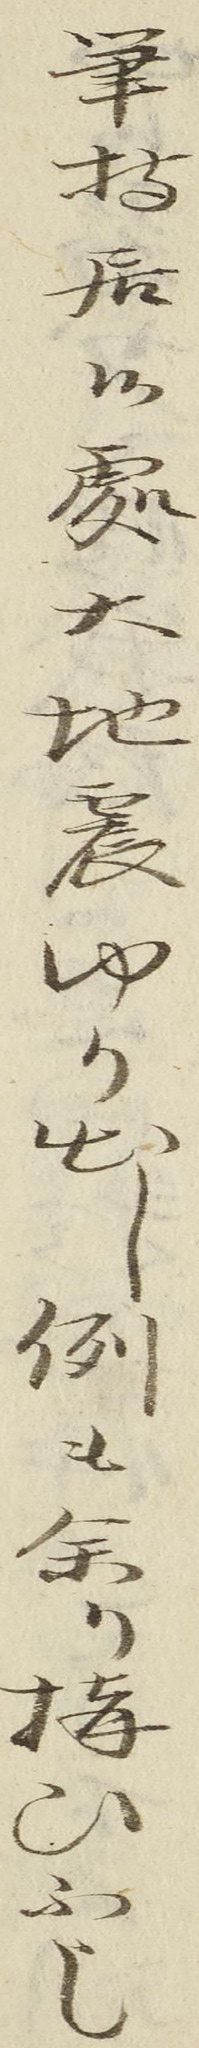筆持居候処大地震ゆり出し例も余り構ひ不申候
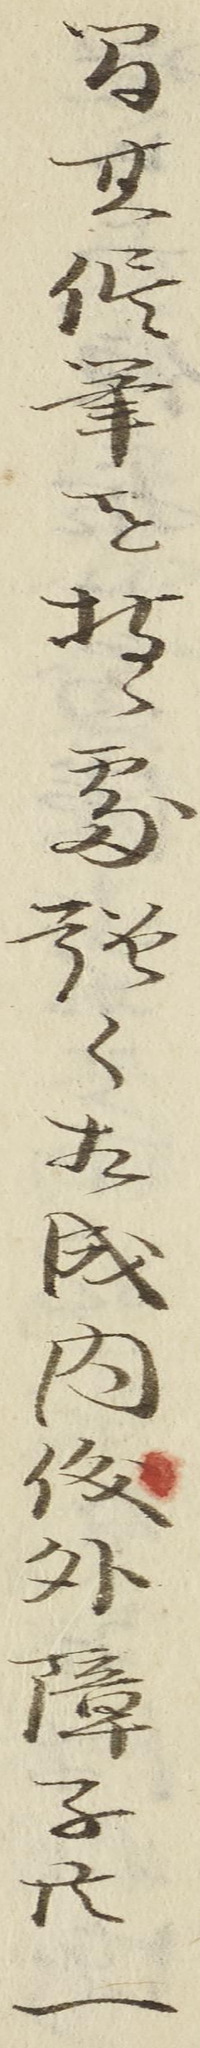間其侭筆持候処強く相成内口外障子共一
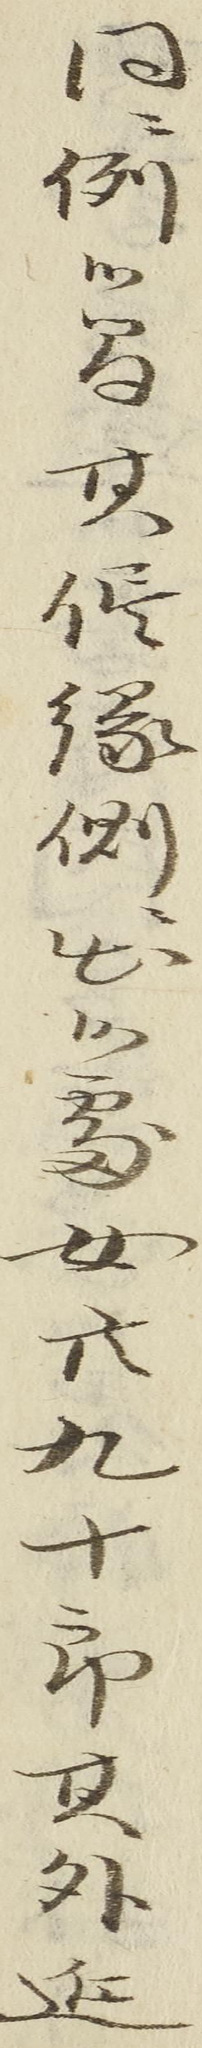同二倒候間其侭縁頬二出候処女共九十郎其外近
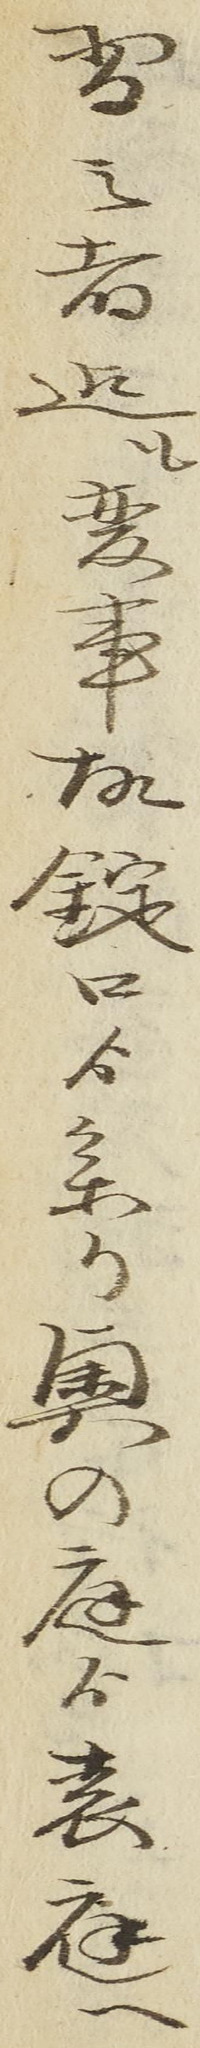習之者迄も変事故錠口ゟ参り奥之庭ゟ表庭へ

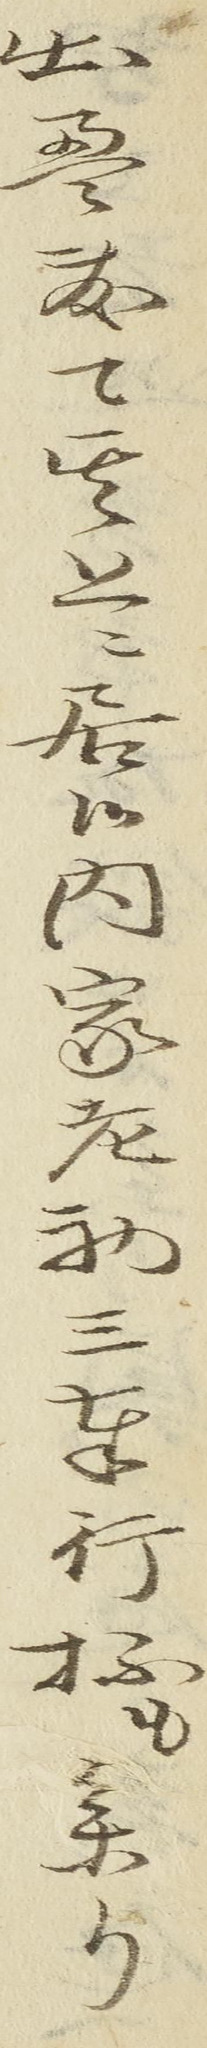出畳敷て其上二居候内家老初三奉行抔も参り
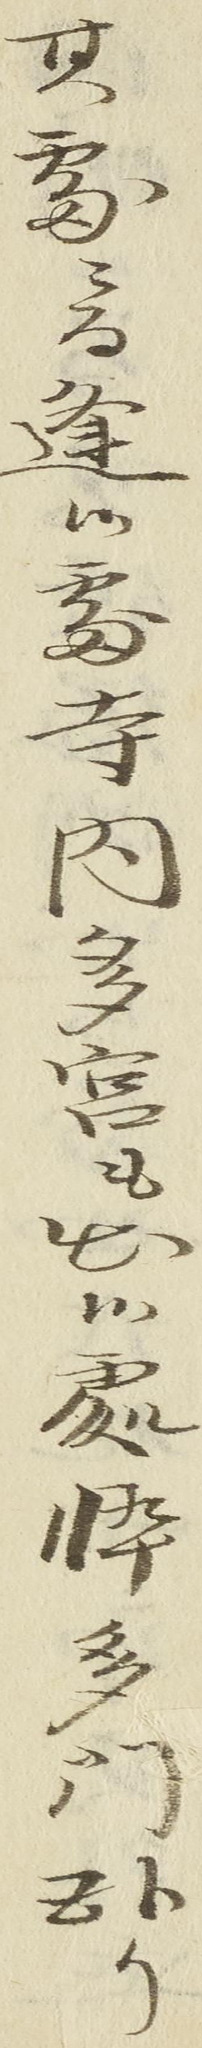其処二而逢候処寺内田宮も出候処忰多門臥り
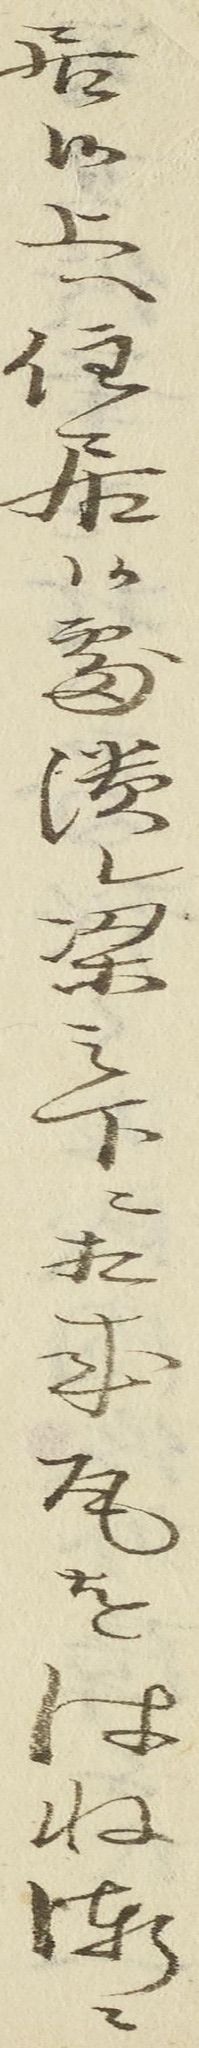居候上へ住居候処潰ㇾ梁之下二相成瓦其外をはね漸々
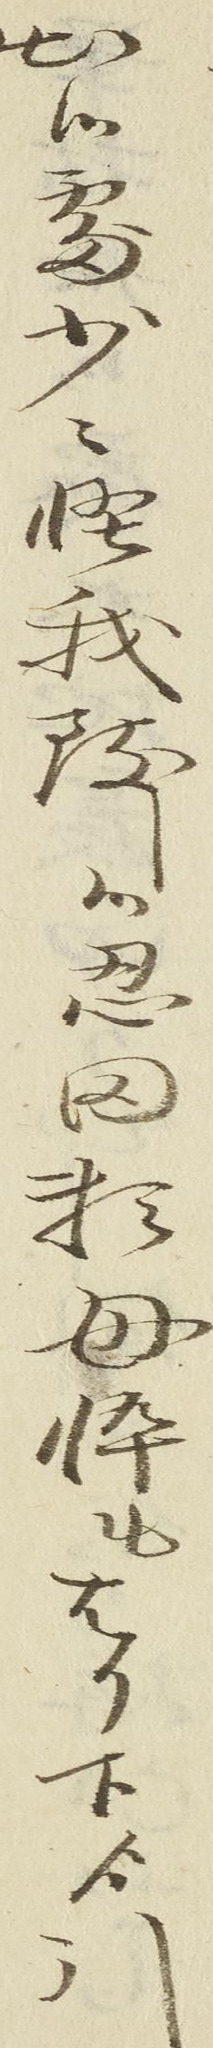出候処少々怪我致候恩田頼母忰もはり下タゟ引
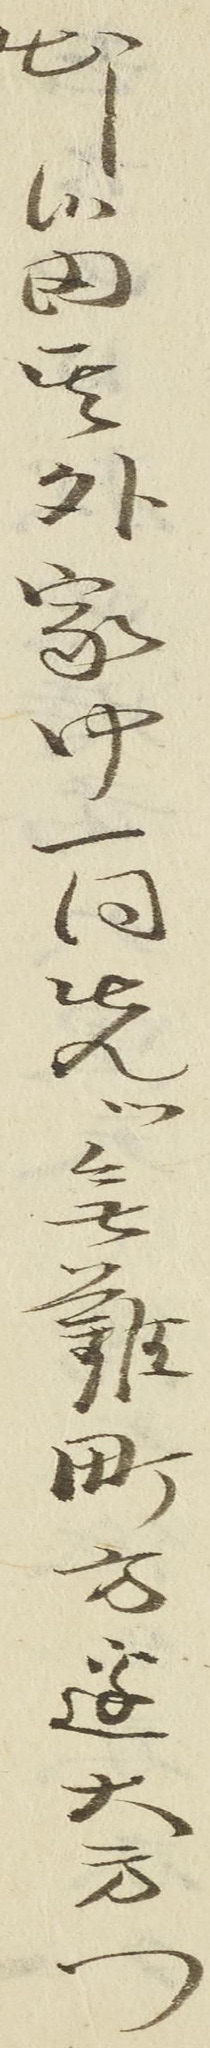出し候由其外家中一同先ッ無難町方辺大方つ
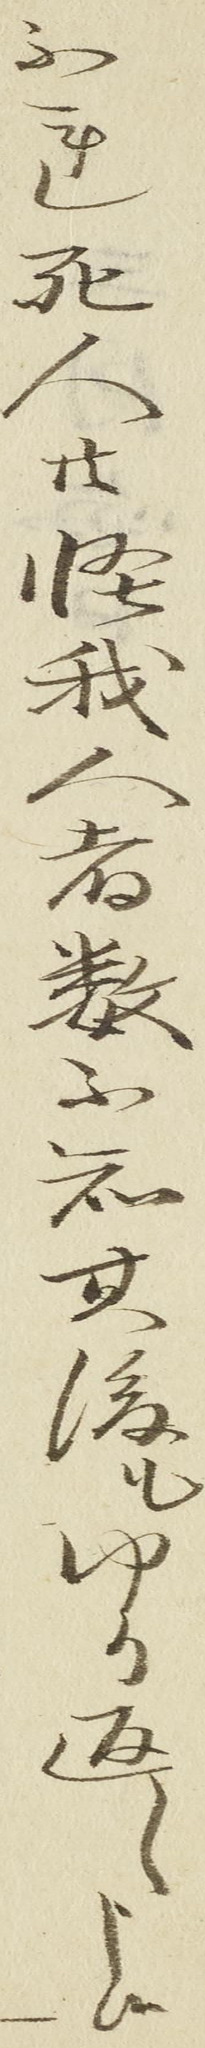ふれ死人共怪我人ハは数不知其後もゆり返し申候
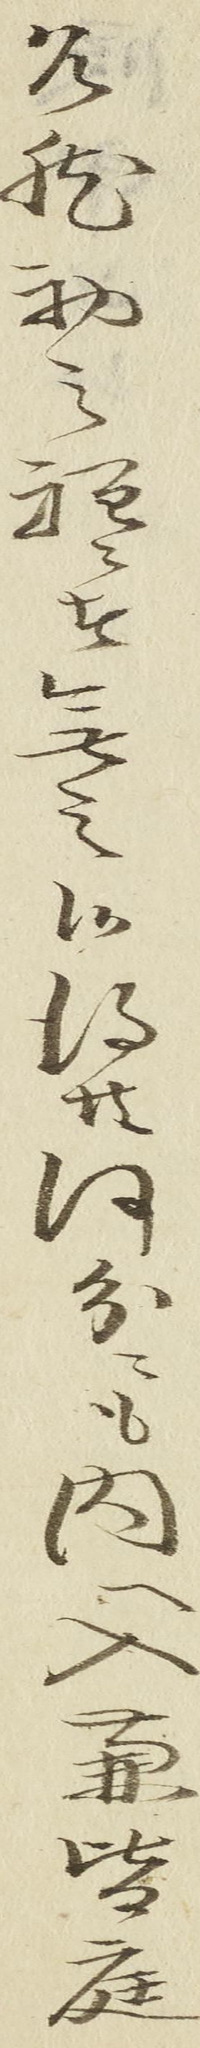乍然初之程二は無之候得共何分二も内へ入り兼皆庭
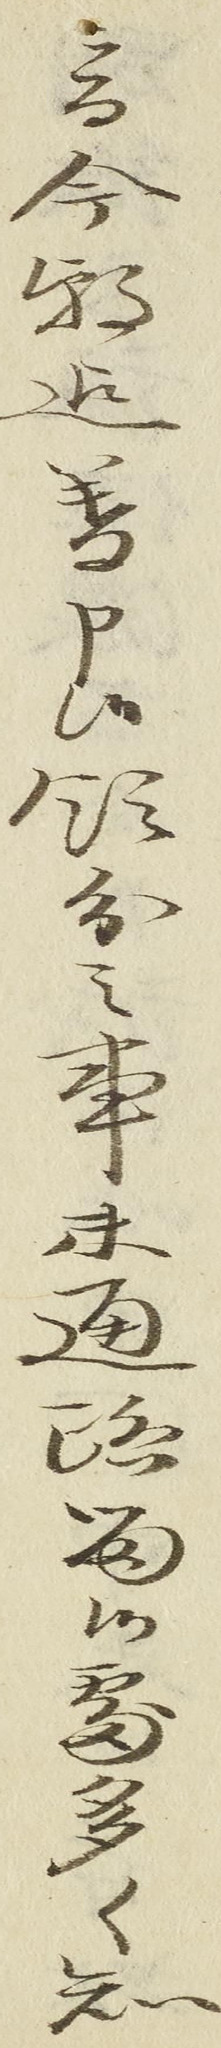二而今朝迄暮申候領分之事未通路留候処多く知
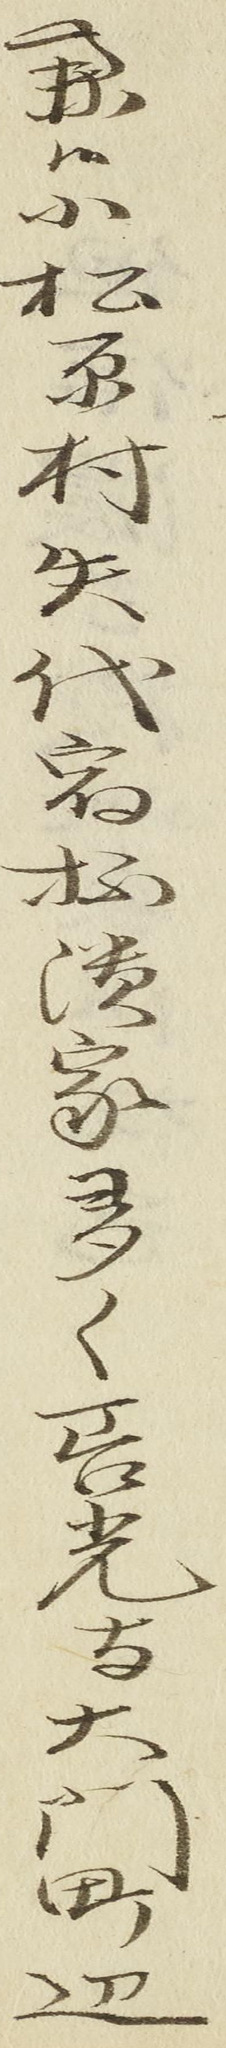兼候小松原村矢代宿抔潰家多く善光寺大門町辺
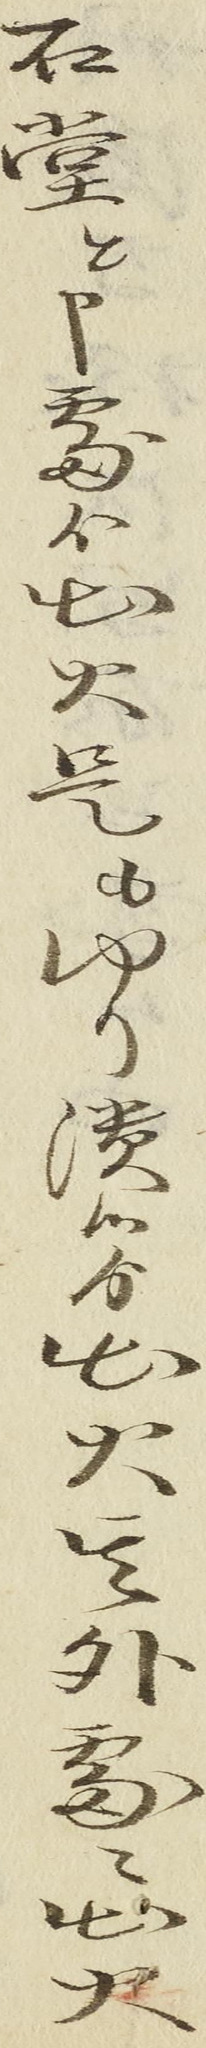石堂と申処ゟ出火是もゆり潰候ゟ出火其外処々出火
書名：信濃國大地震記　乾
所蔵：東京大学地震研究所図書室 Earthquake Research Institute Library, The University of Tokyo, JAPAN
